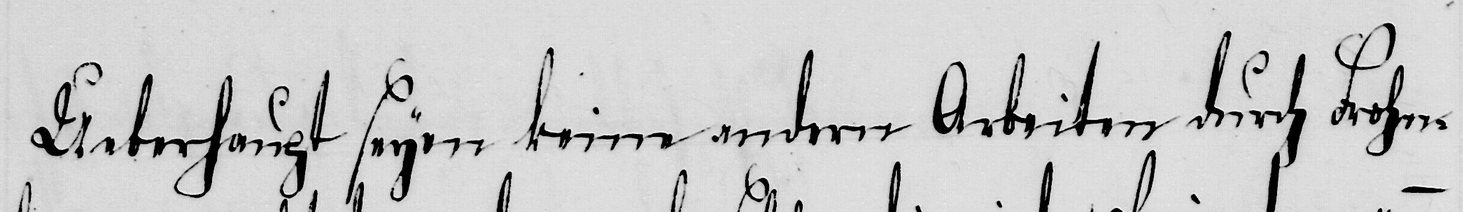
Ueberhaupt seyen keine andern Arbeiten durch Froh¬
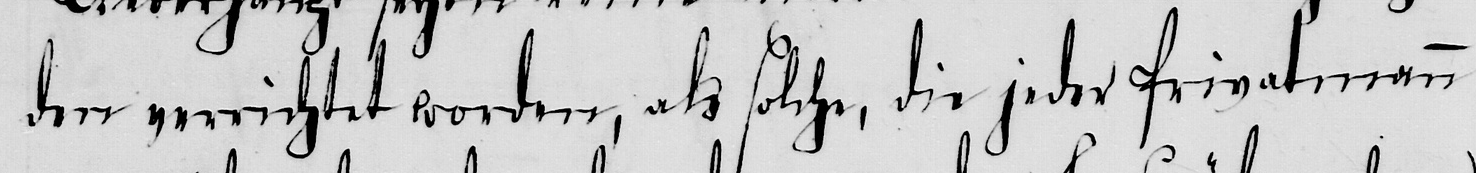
nden verrichtet worden, als solche, die jeder Privatmann
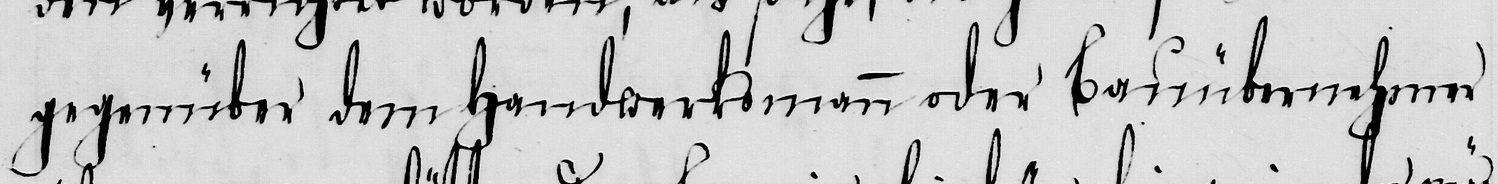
gegenüber dem Handwerksmann oder Bauübernehmer
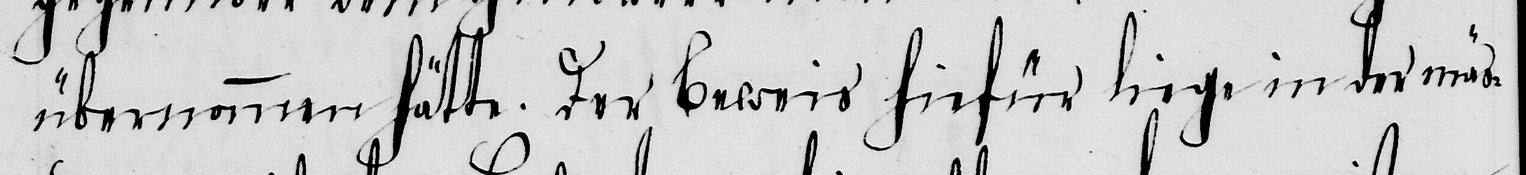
übernommen hätte. Der Beweis hiefür liege in der mäß¬
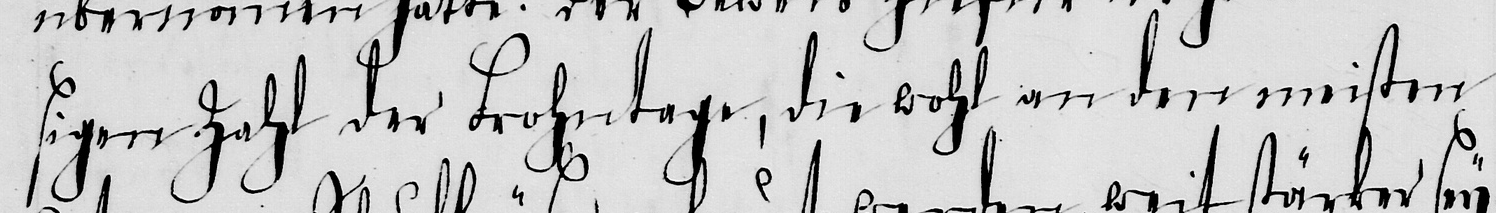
igen Zahl der Frohntage, die wohl an den meisten
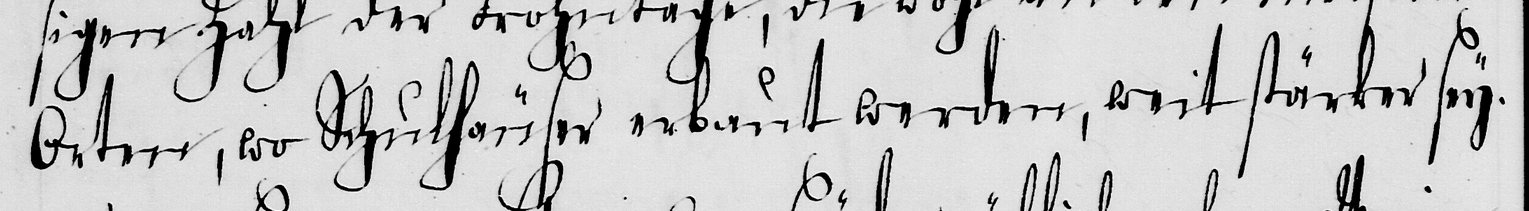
Orten, wo Schulhäuser erbaut werden, weit stärker sey.
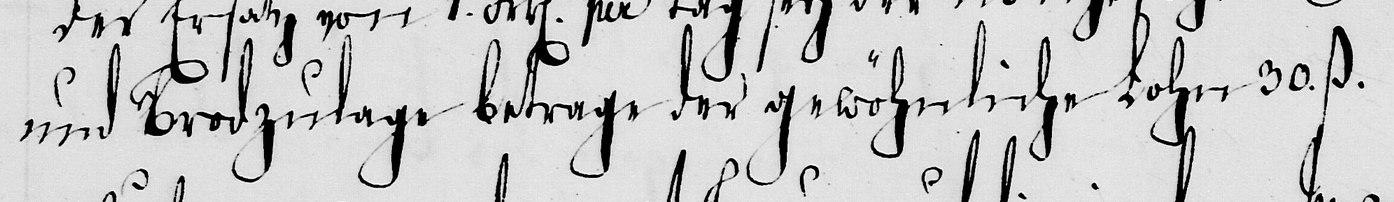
und Brodzulage betrage der gewöhnliche Lohn 30. ß.
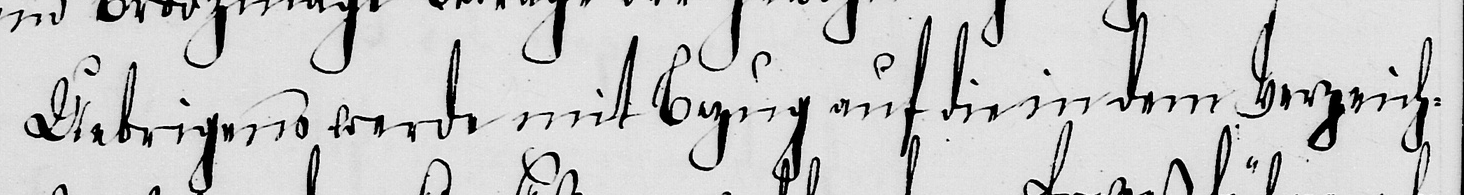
Uebrigens werde mit Bezug auf die in dem Verzeich¬
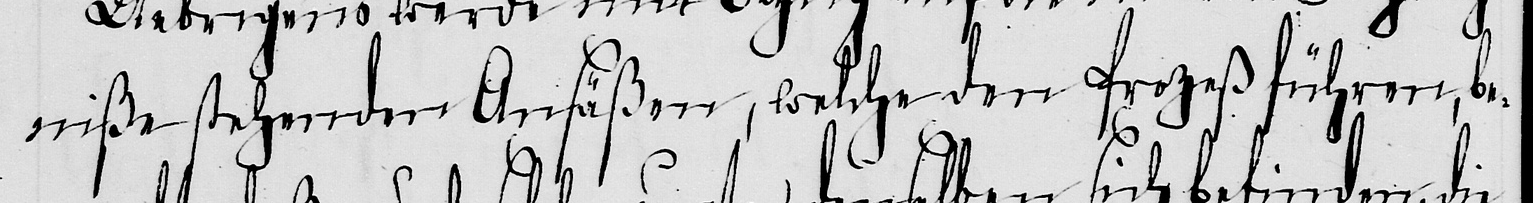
niße stehenden Ansäßen, welche den Prozeß führen, be¬
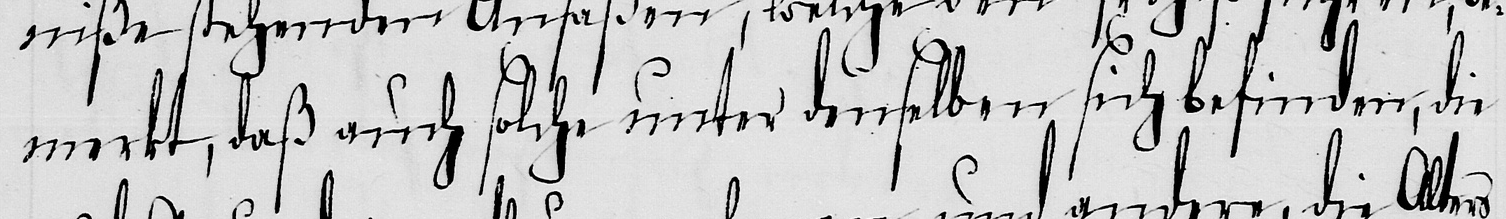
merkt, daß auch solche unter demselben sich befinden, die
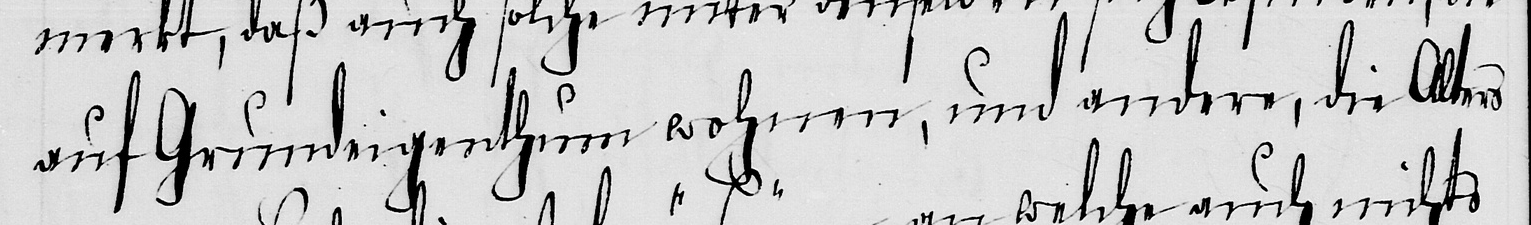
auf Grundeigenthum wohnen, und andere, die Alte¬
